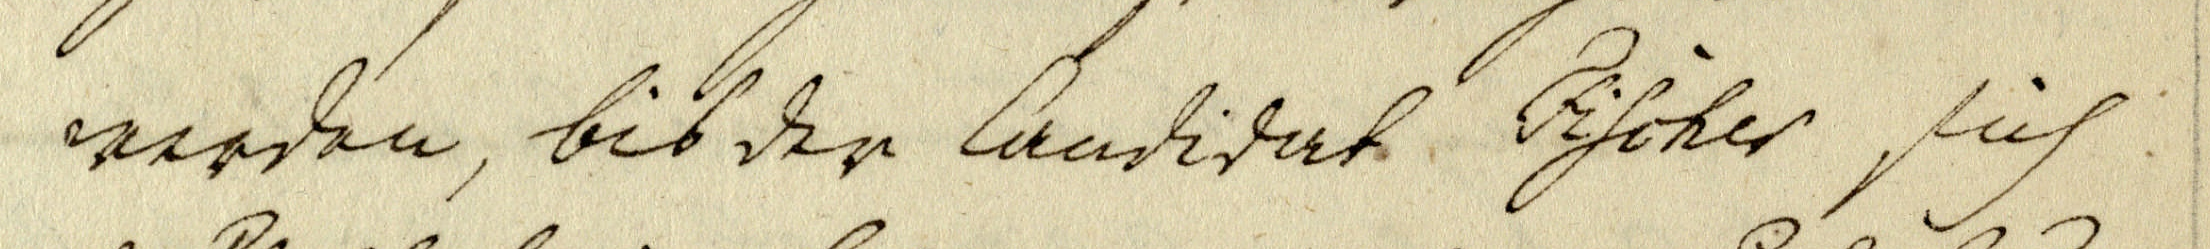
werden, bis der Candidat Fischer sich
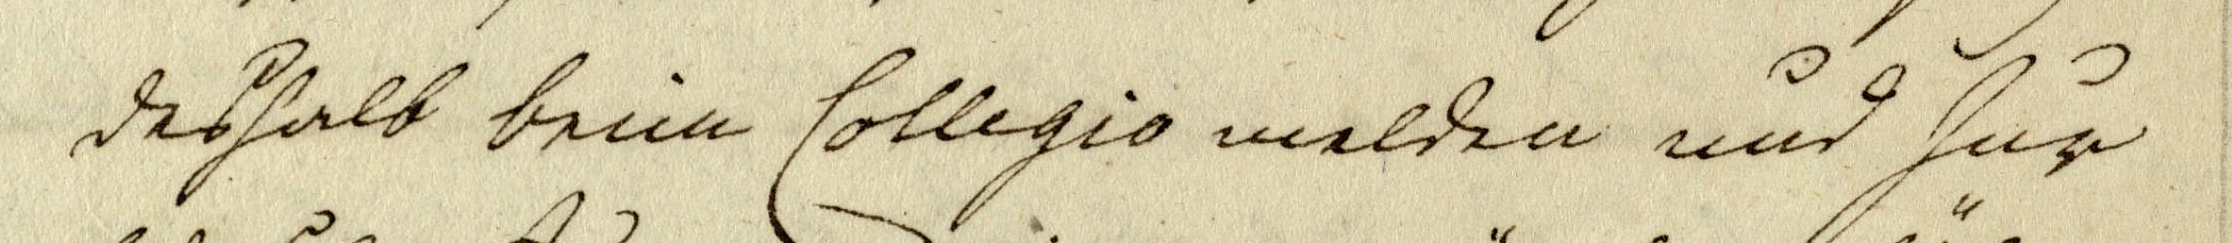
deshalb beim Collegio melden und zur
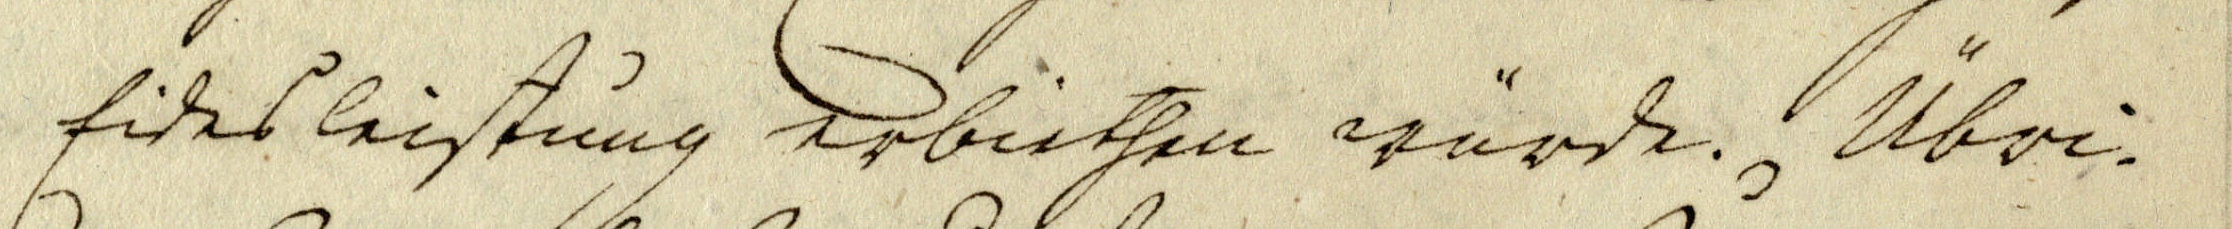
Eidesleistung erbethen würde. Übri¬
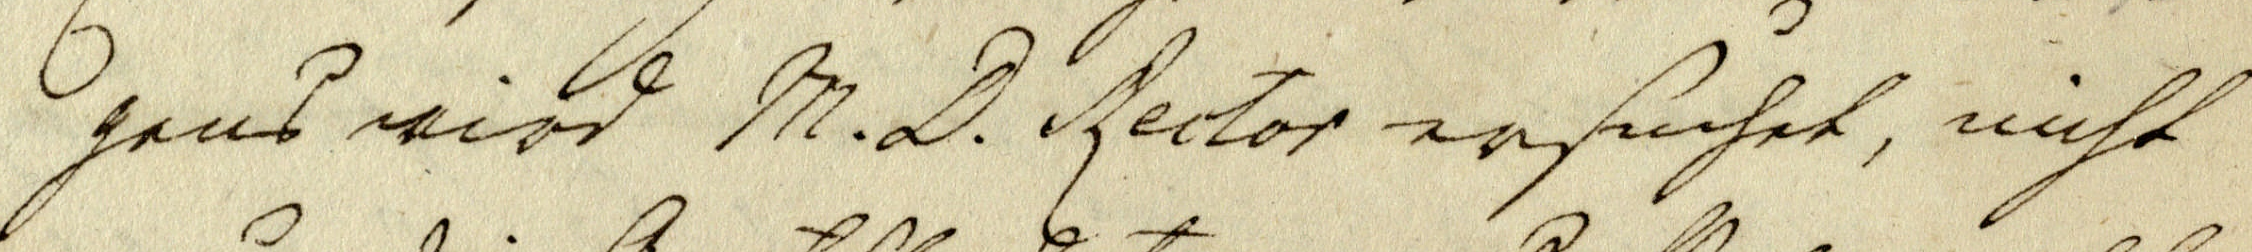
gens wird M. D. Rector ersuchet, nicht
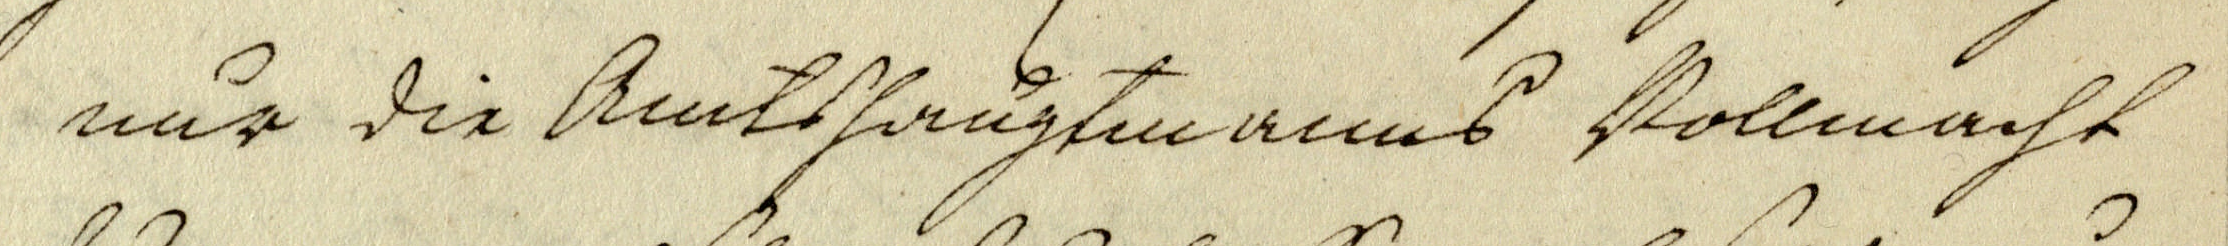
nur die Amtshauptmanns Vollmacht
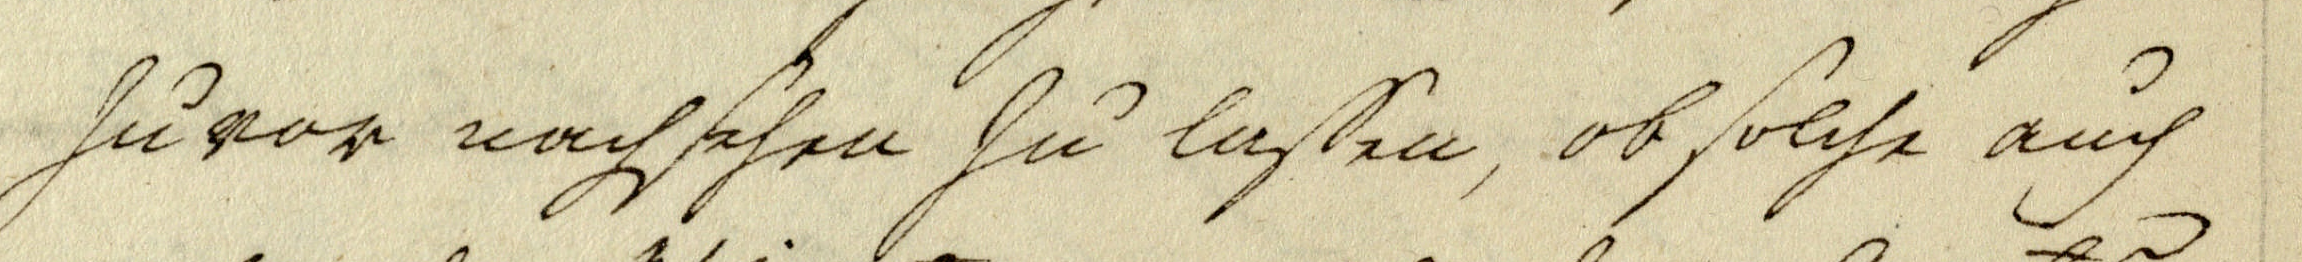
zu vor nachsehen zu lassen, ob solche auch
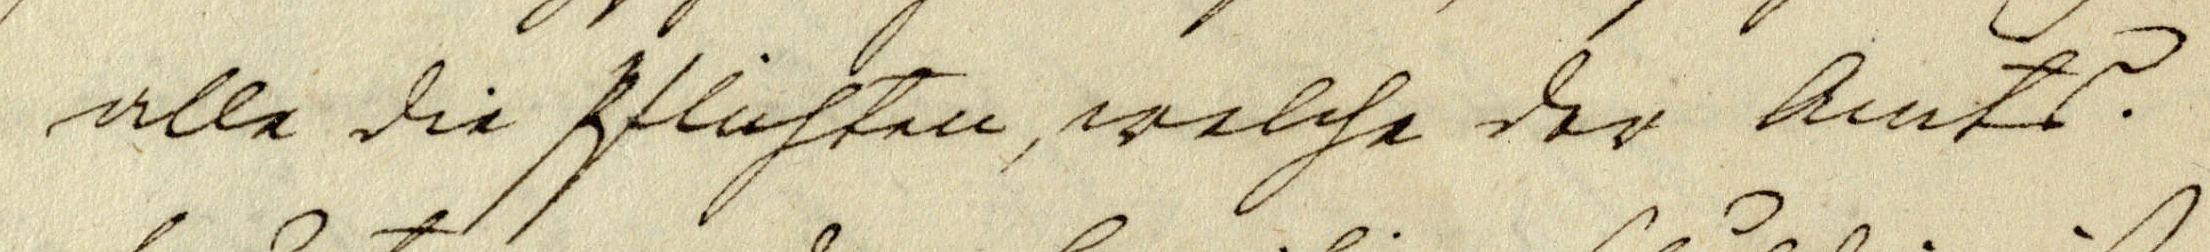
alle die Pflichten, welche der Amts¬
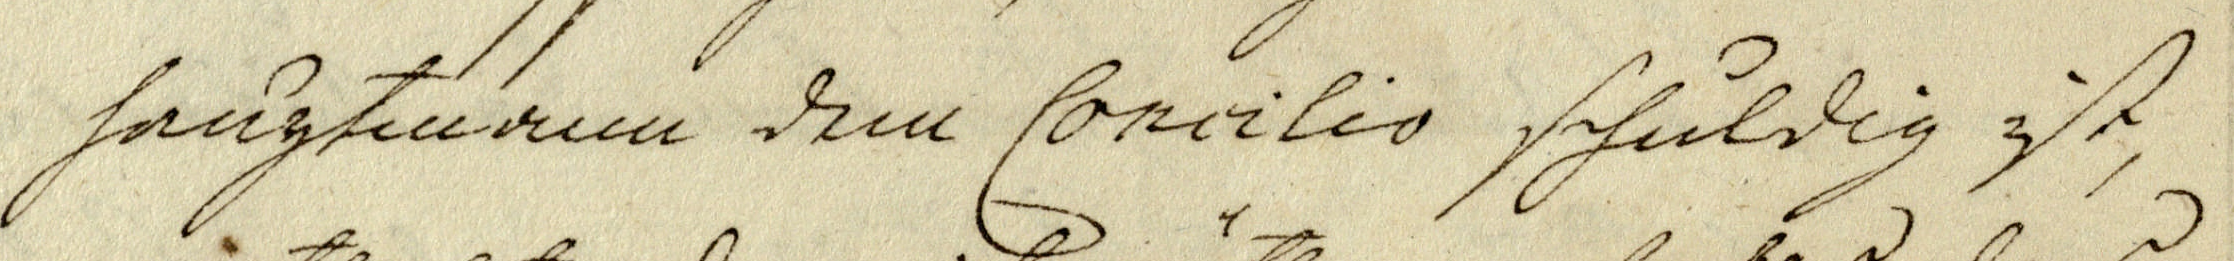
hauptmann dem Concilio schuldig ist,
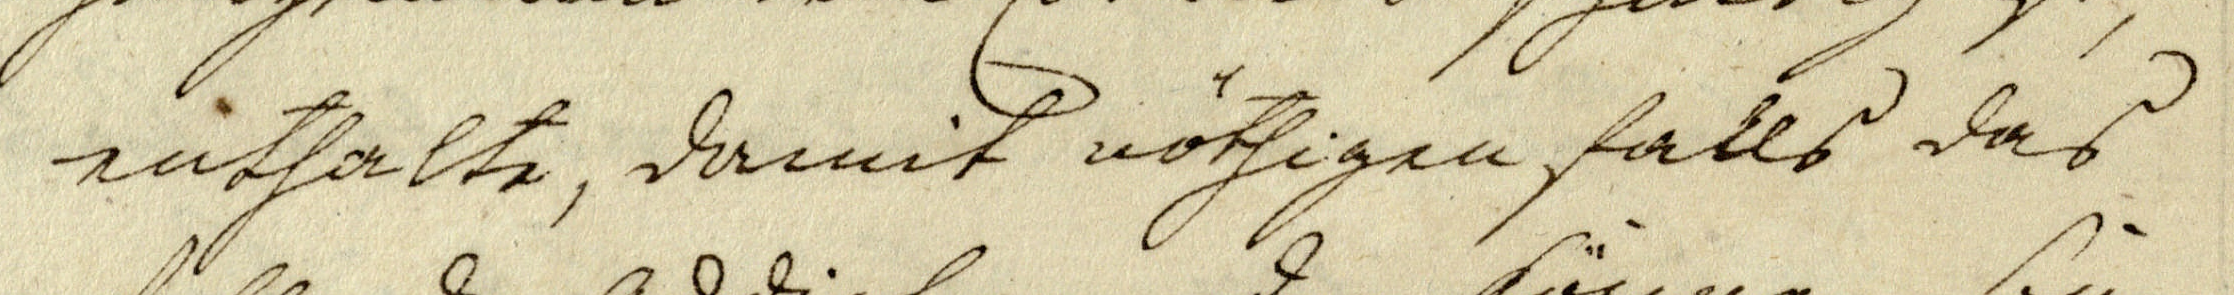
enthalte, damit nöthigen falls das
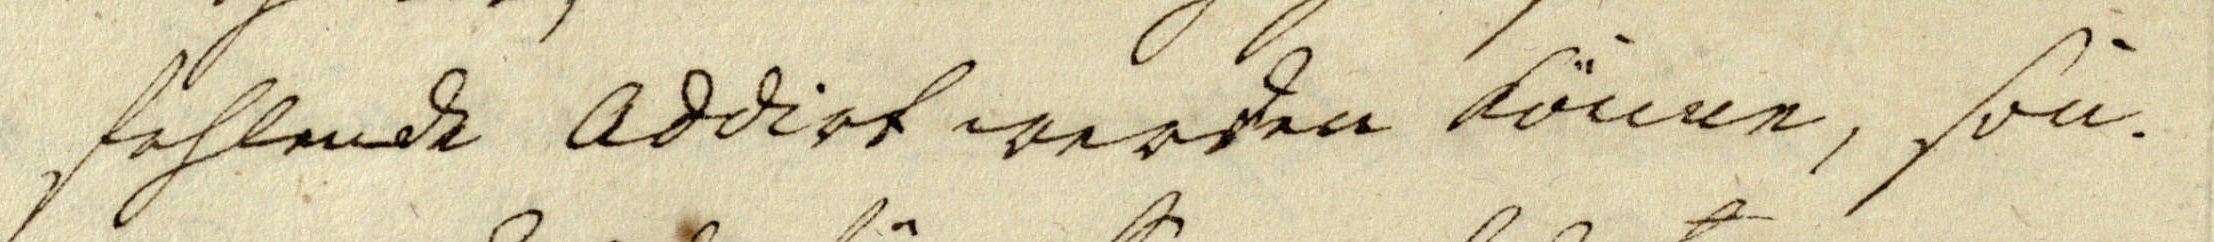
fehlenden Addirt werden könne, son¬
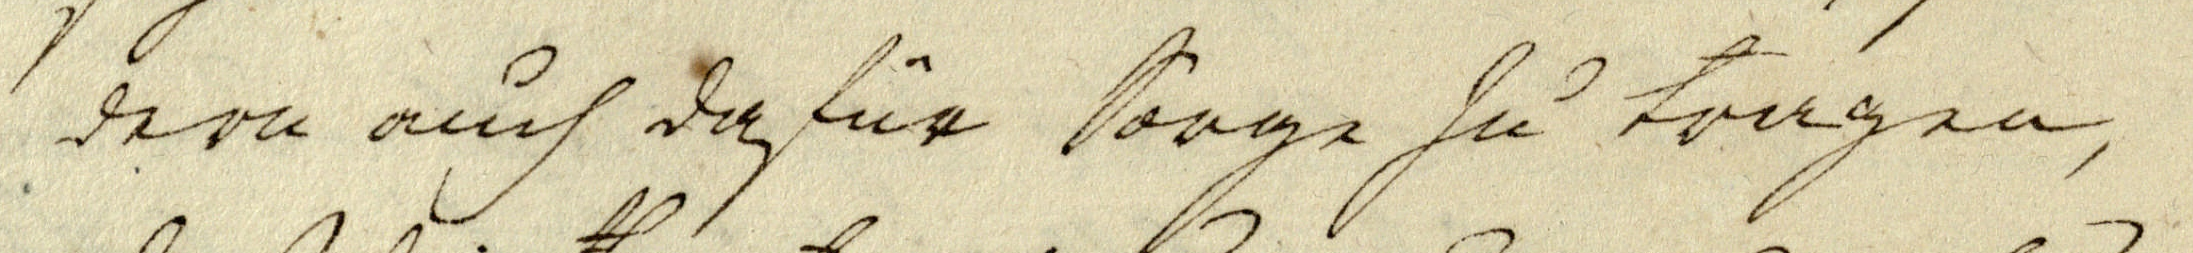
dern auch dafür Sorge zu tragen,
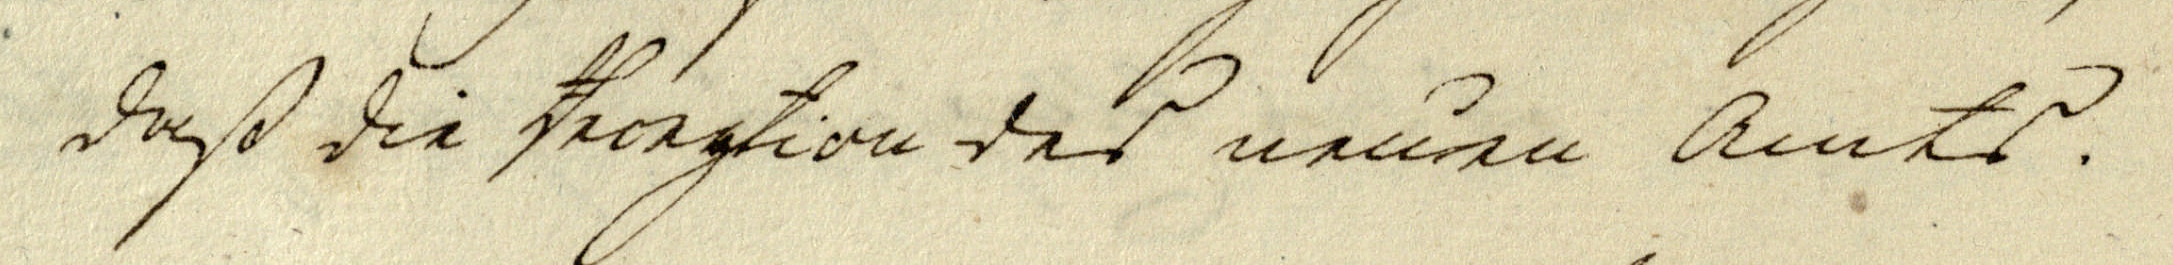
daß die Reception des neuen Amts¬
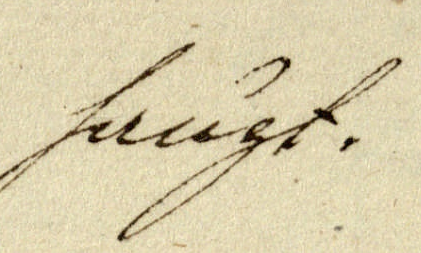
haupt
